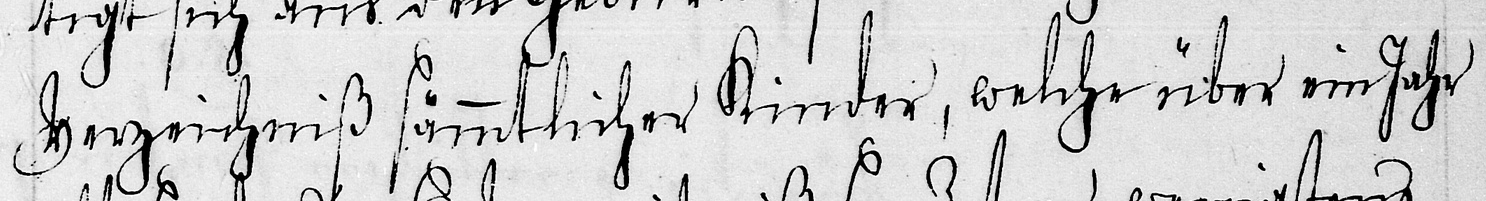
Verzeichniß sämmtlicher Kinder, welche über ein Jahr
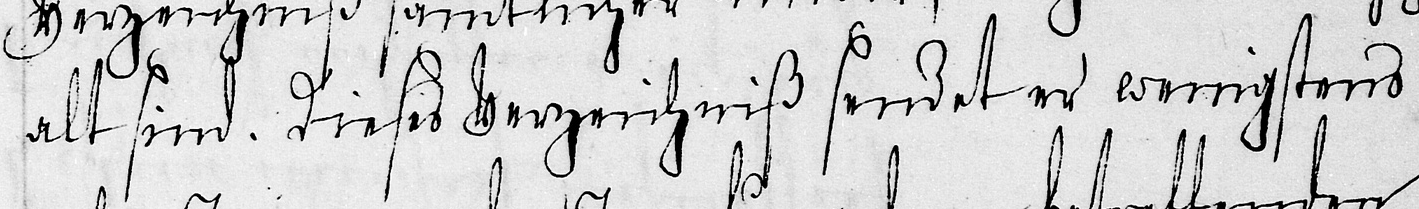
alt sind. Dieses Verzeichniß sendet er wenigstens
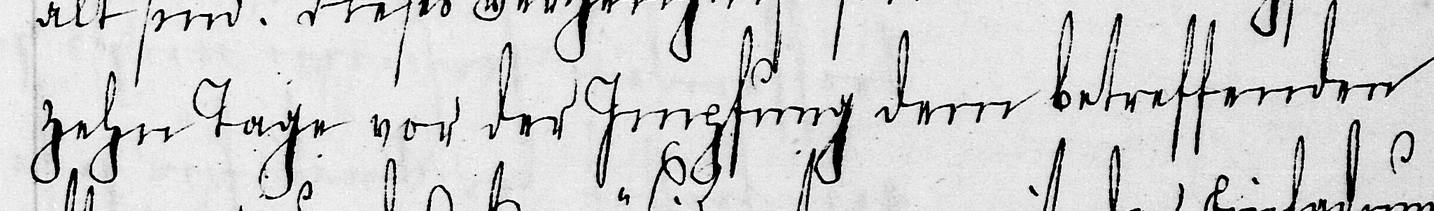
zehn Tage vor der Impfung dem betreffenden
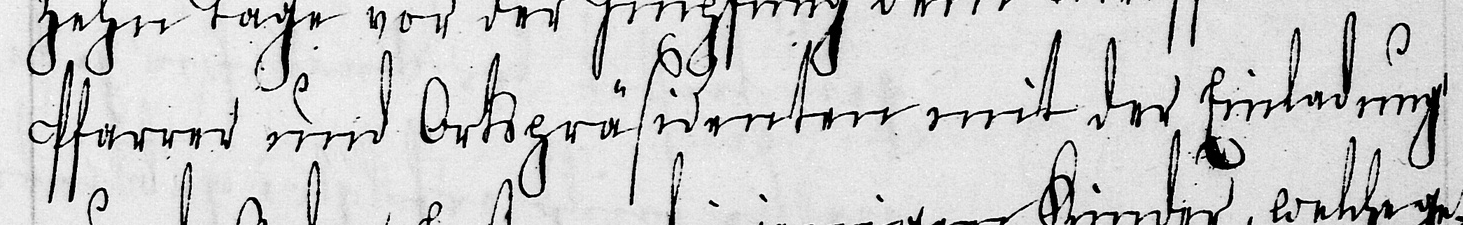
Pfarrer und Ortspräsidenten mit der Einladung
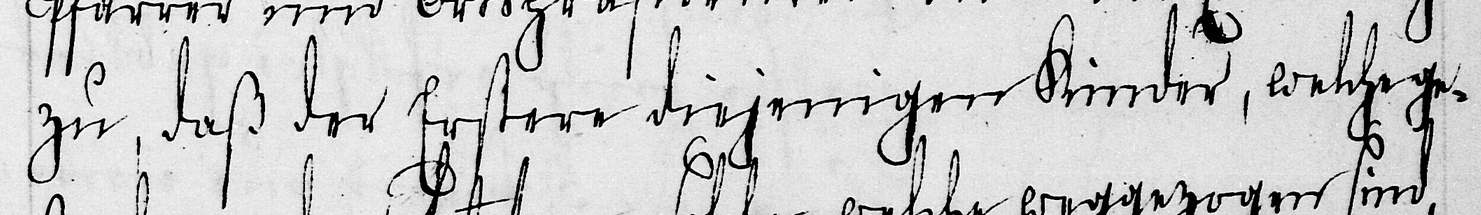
zu, daß der Erstere diejenigen Kinder, welche ge¬
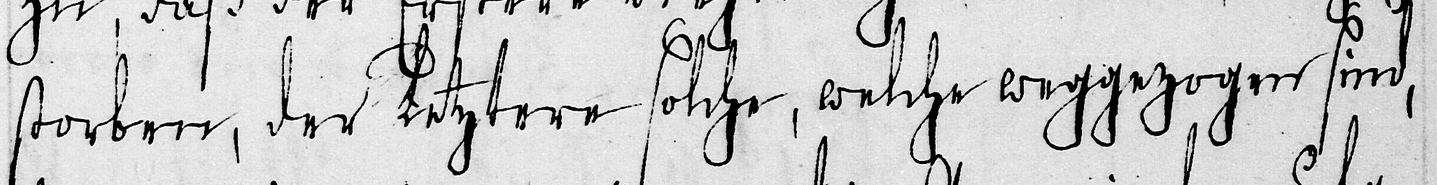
storben, der Letztere solche, welche weggezogen sind,
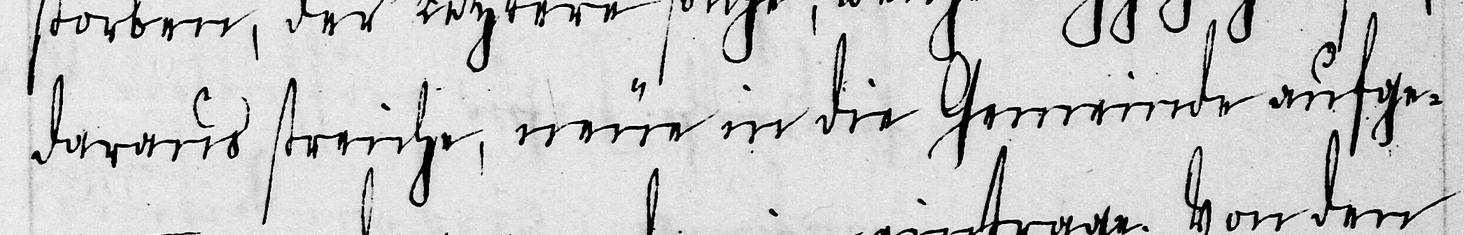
daraus streiche, neue in die Gemeinde aufge¬
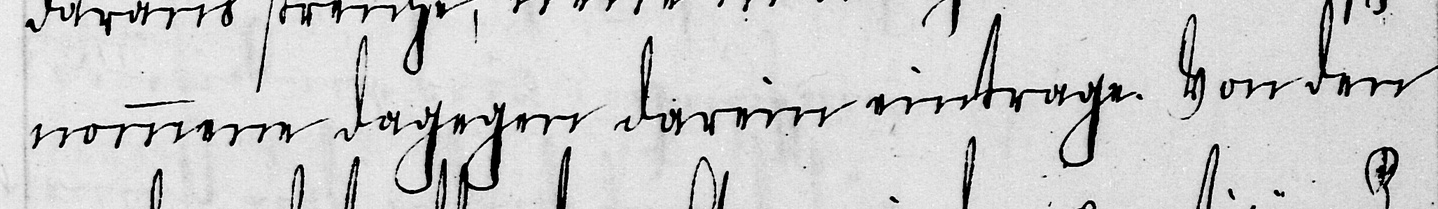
nommene dagegen darein eintrage. Von den
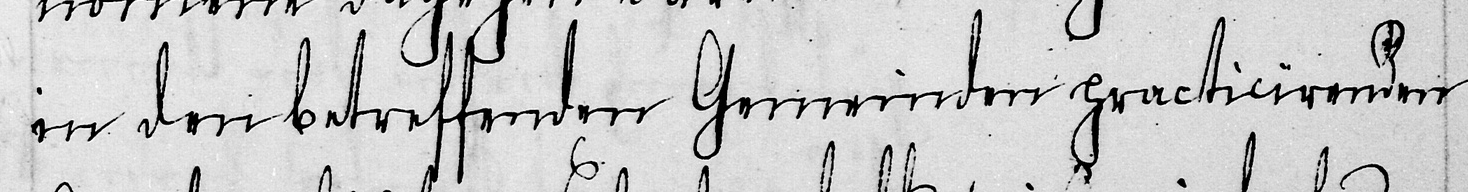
in den betreffenden Gemeinden practicirenden
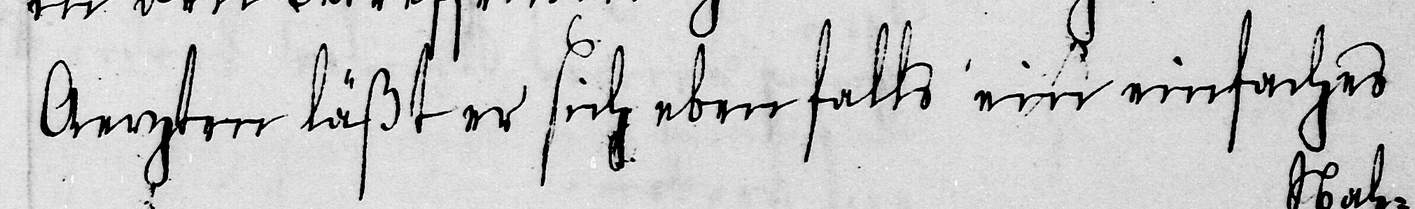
Aerzten läßt er sich ebenfalls ein einfaches
